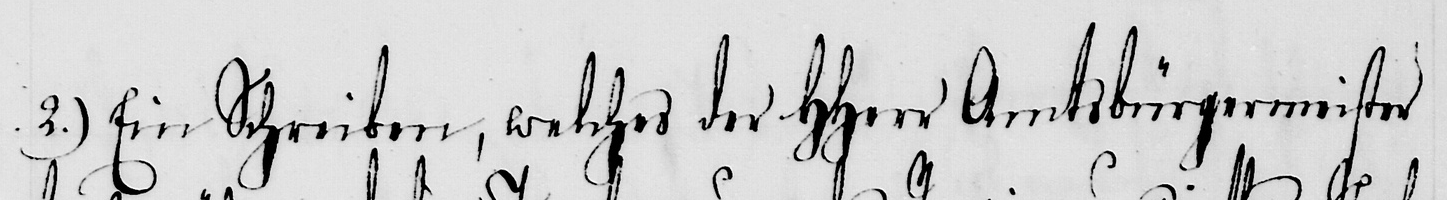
2.) Ein Schreiben, welches der HHerr Amtsbürgermeister
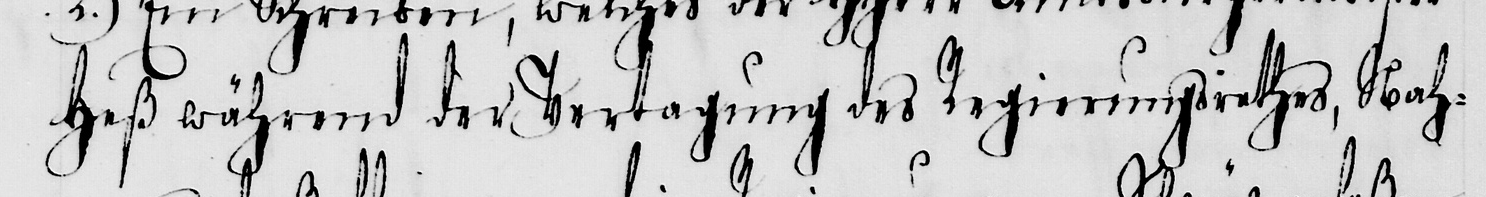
Heß während der Vertagung des Regierungsrathes, Nah¬
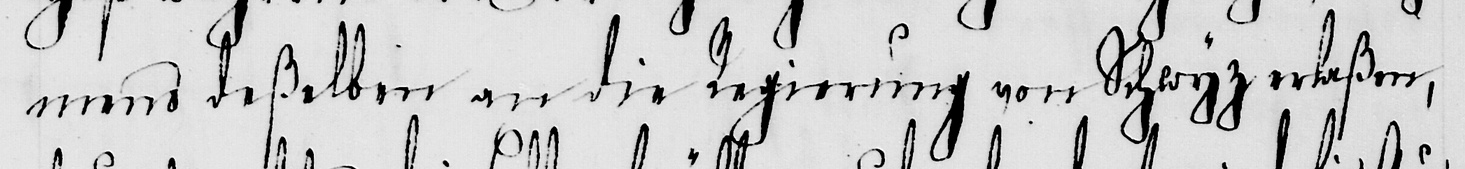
mens deßelben an die Regierung von Schwyz erlaßen,
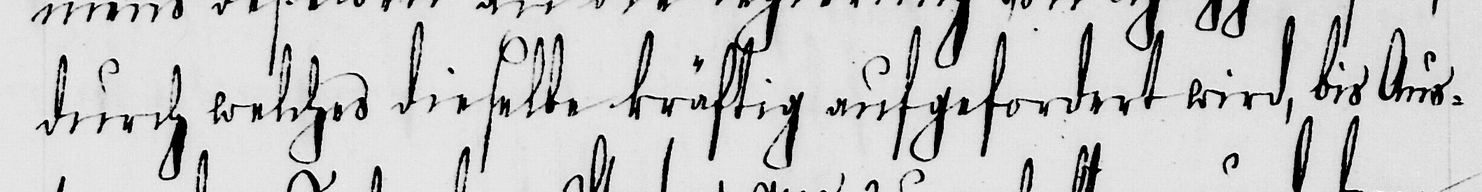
durch welches dieselbe kräftig aufgefordert wird, bis Aus¬
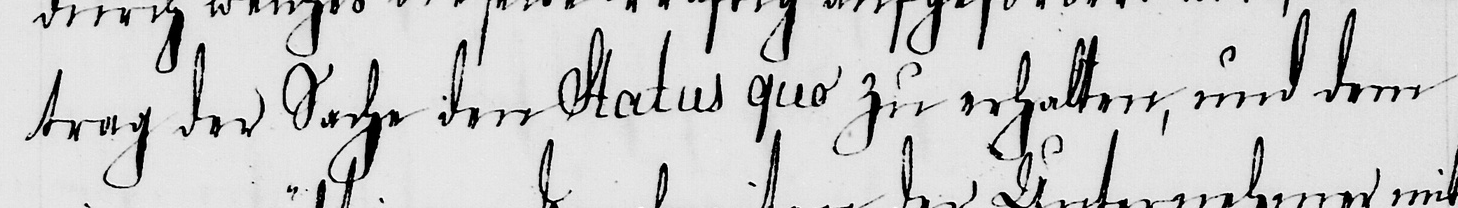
trag der Sache den Status quo zu erhalten, und dem
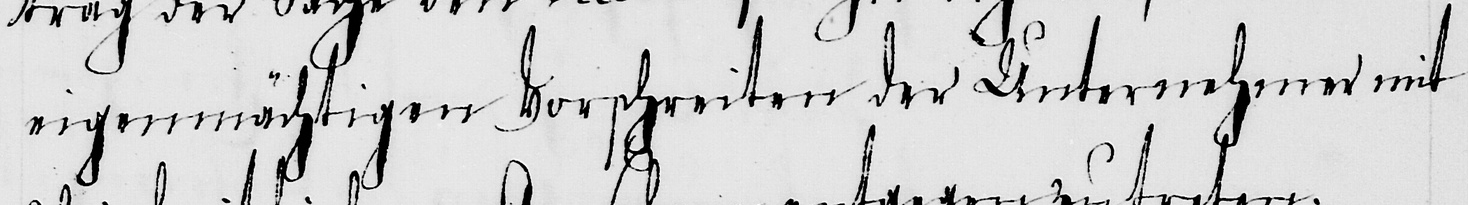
eigenmächtigen Vorschreiten der Unternehmer mit
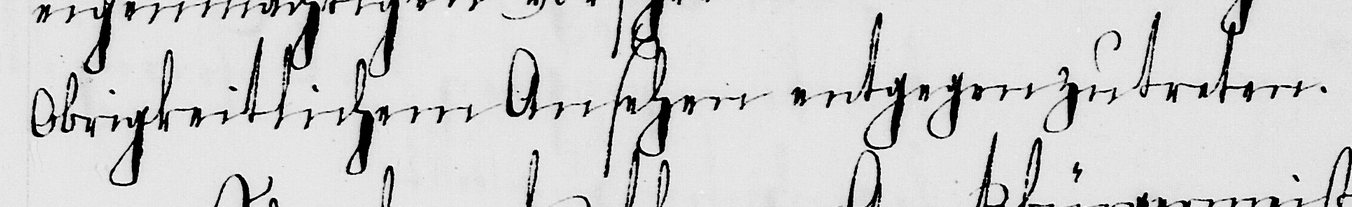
Obrigkeitlichem Ansehen entgegen zu treten.
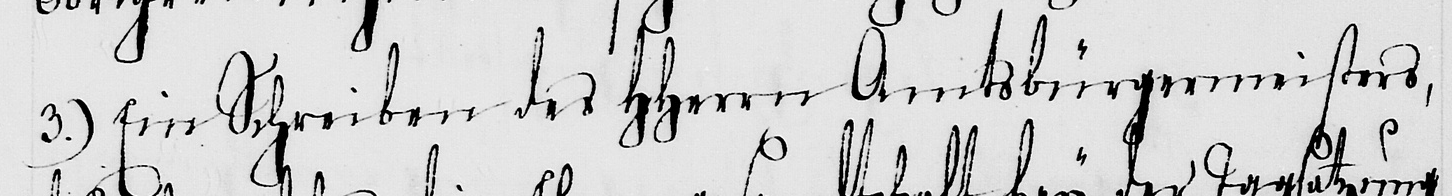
3.) Ein Schreiben des HHerrn Amtsbürgermeisters,
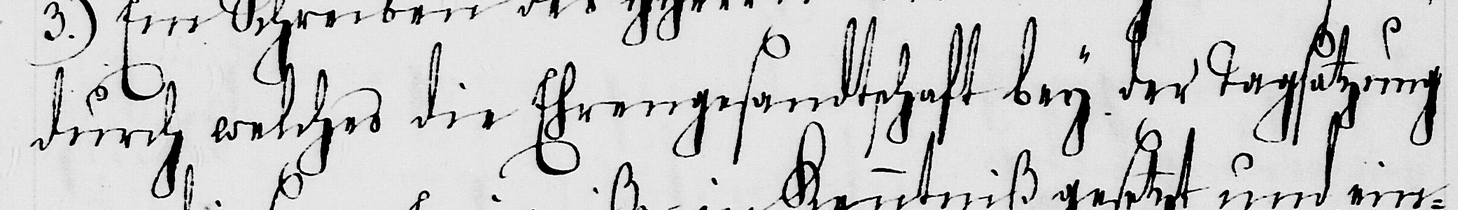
durch welches die Ehrengesandtschaft bey der Tagsatzung
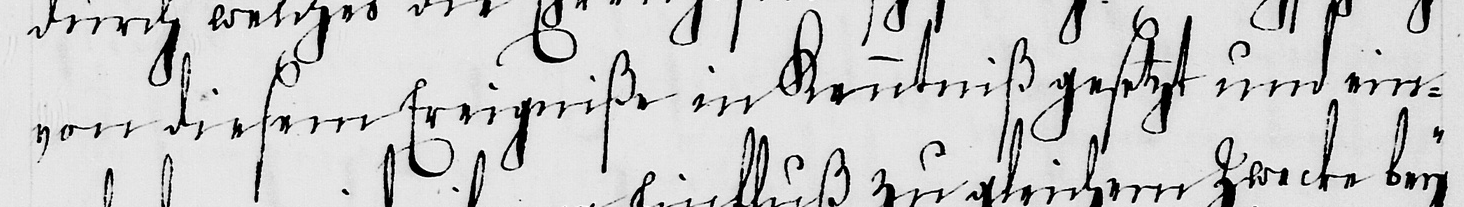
von diesem Ereigniße in Kenntniß gesetzt und ein¬
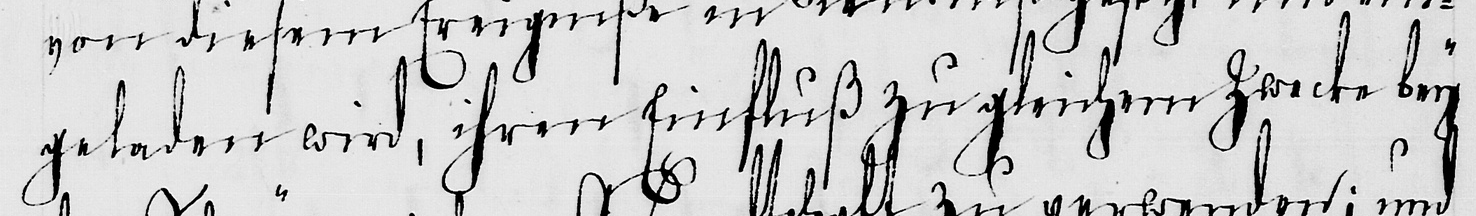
geladen wird, ihren Einfluß zu gleichem Zwecke bey
